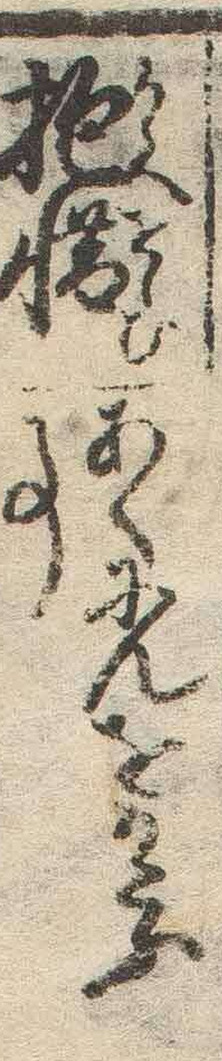抱惜あくにんをかゝふ
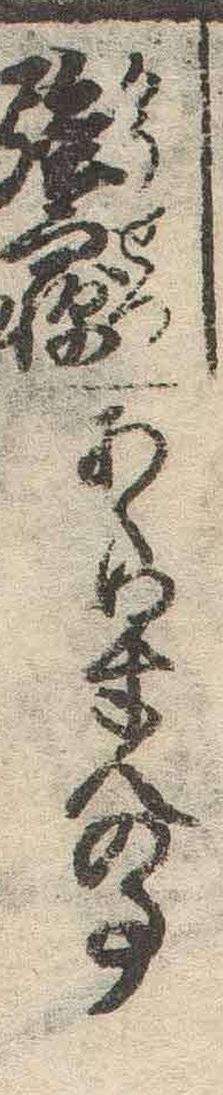強竊あくぬす人の事
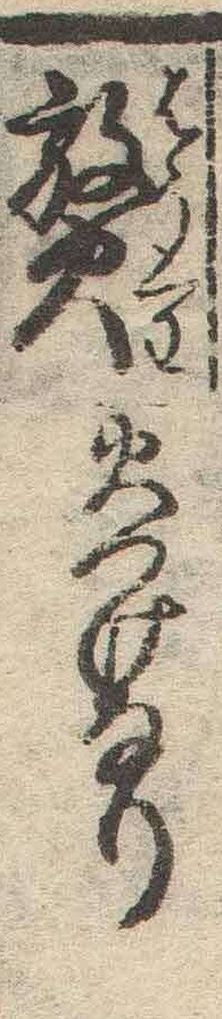放火火つけなり
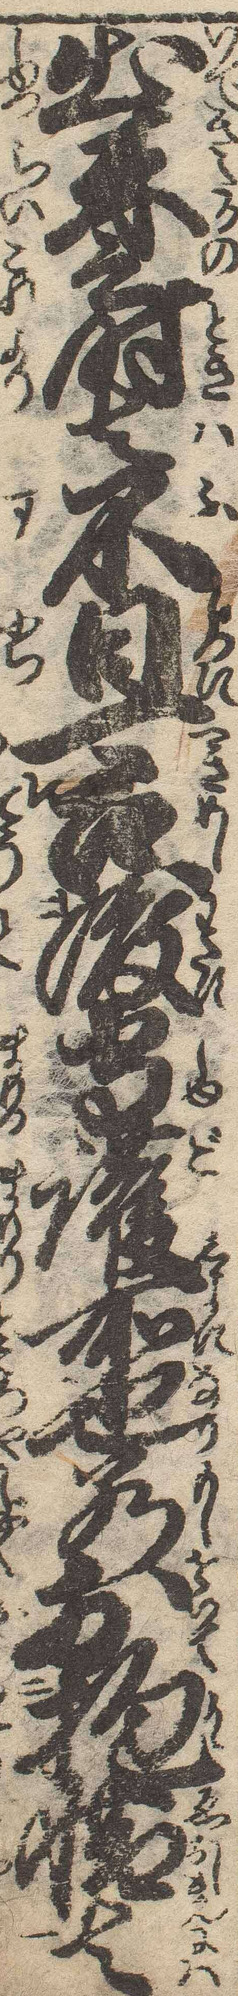出来之時者不日可召-渡守護所也若於抱惜者
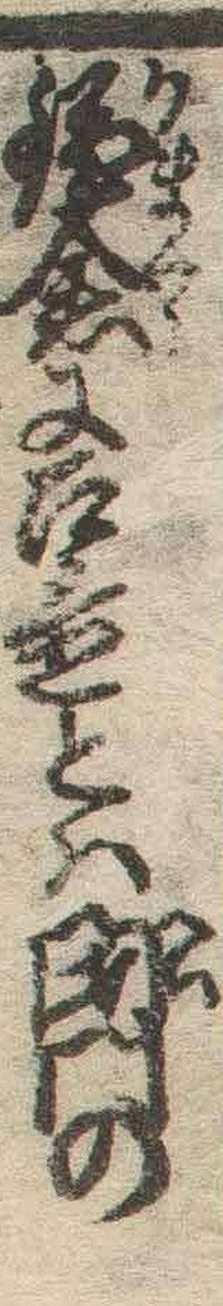鎌倉に召置とは閉門の
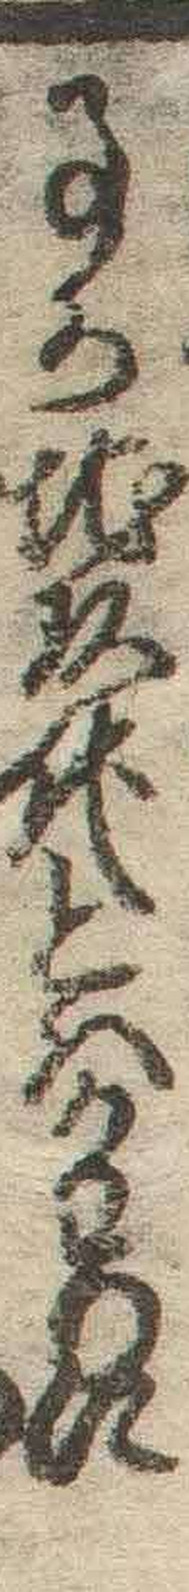事か地頭代とはかわりに
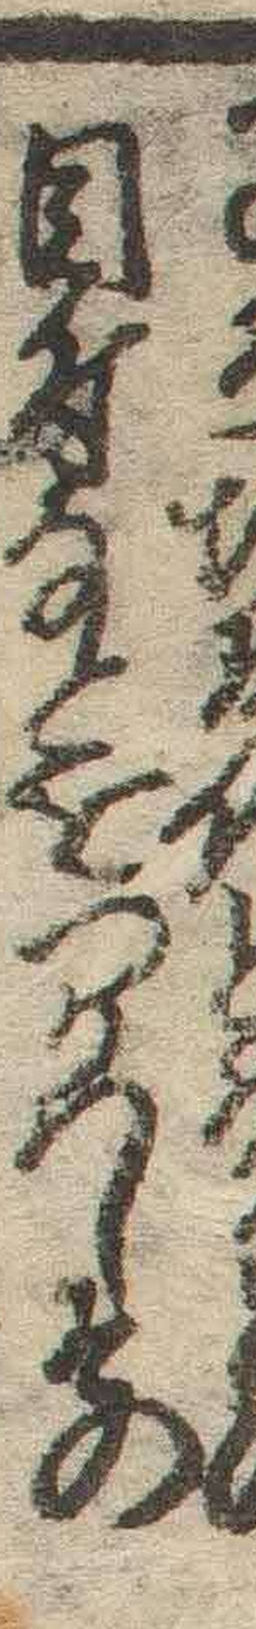目付なとをつけはしその
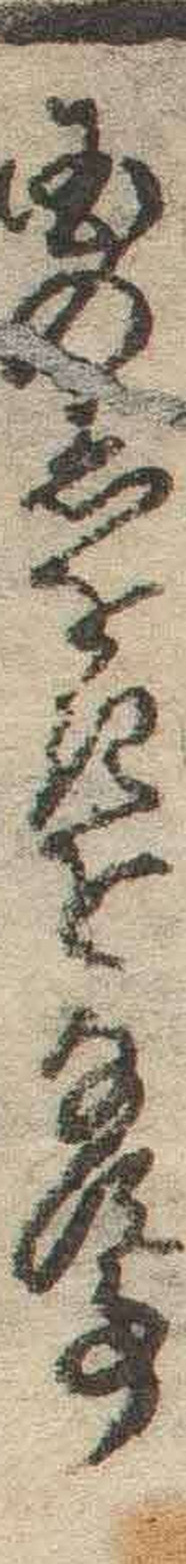国のしをきをなす事
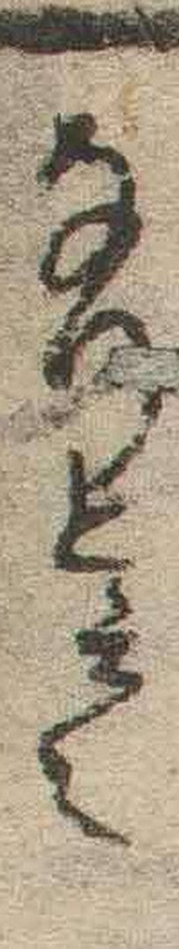なりと云々

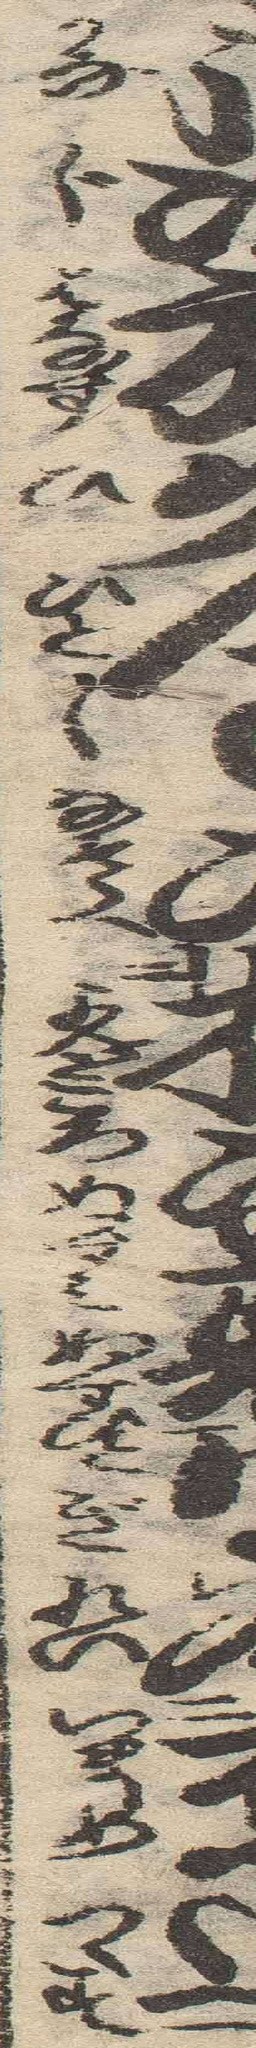かなじはなすひひとしなそらへよんところぬすみぬすひとぎれいいましめつくす
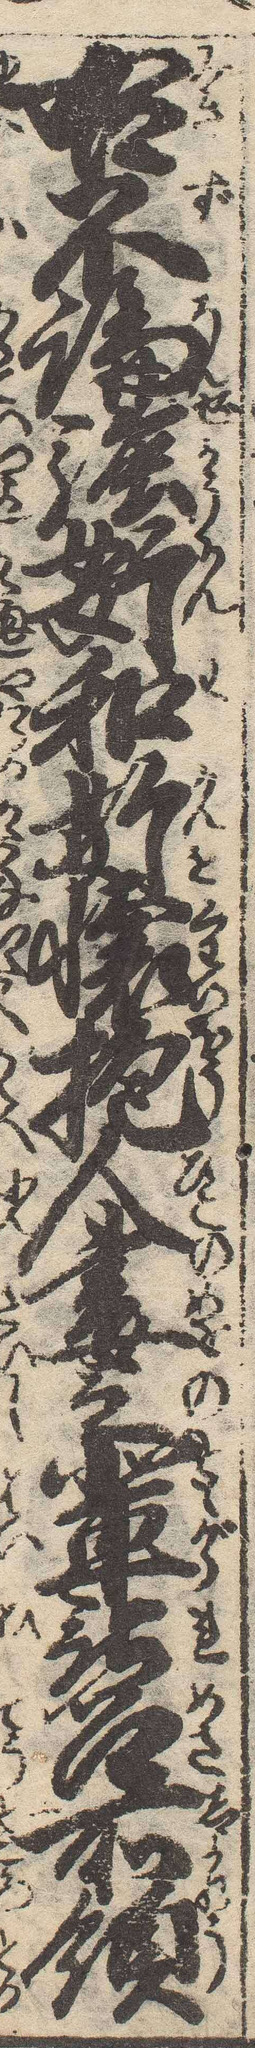右不論強姧和姧懐抱人妻之輩被召所領
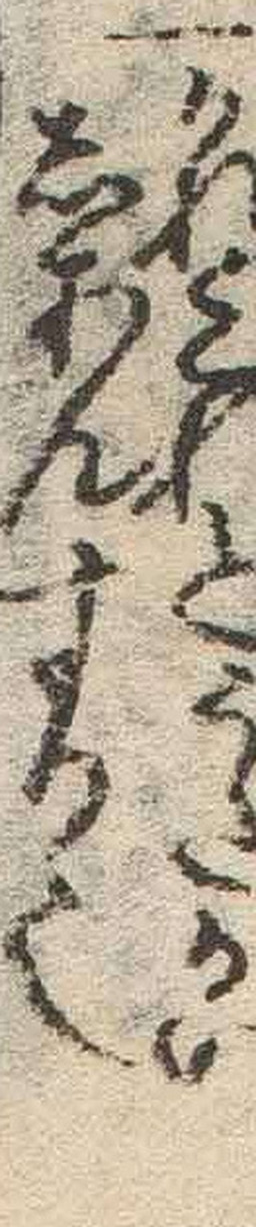しあんする也
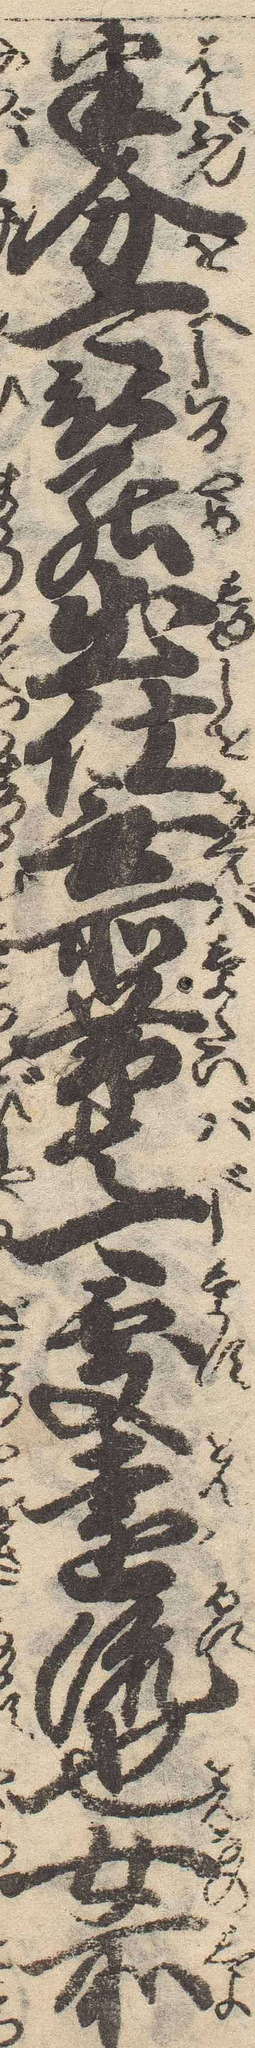半分可被罷出仕無所帯者可處遠流也女所
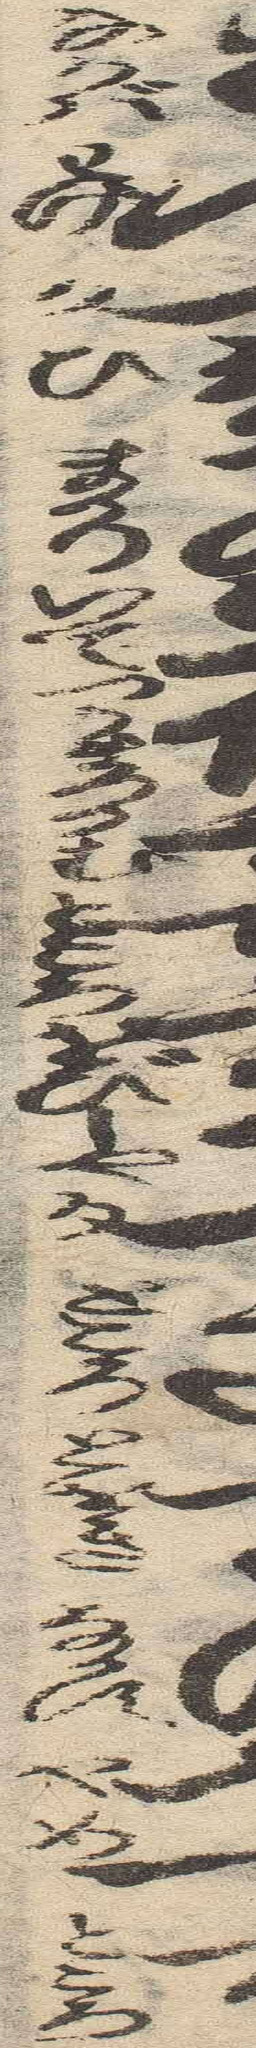なかばわけかひまかりいてつかまつるむところをびしやかところとをきなかすやめところ
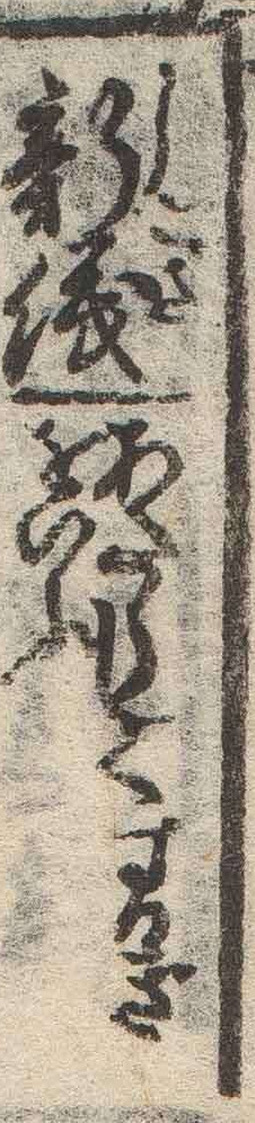新儀あたらしくするぎ
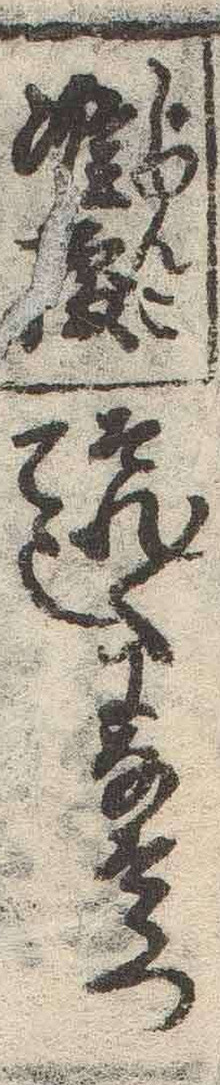准據それ〳〵になそゝつ
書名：御成敗式目絵抄
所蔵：東京学芸大学附属図書館 国文学研究資料館
